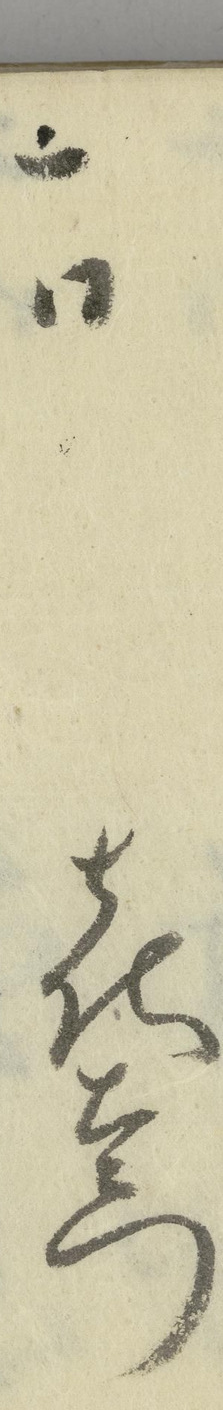一同伝右衛門

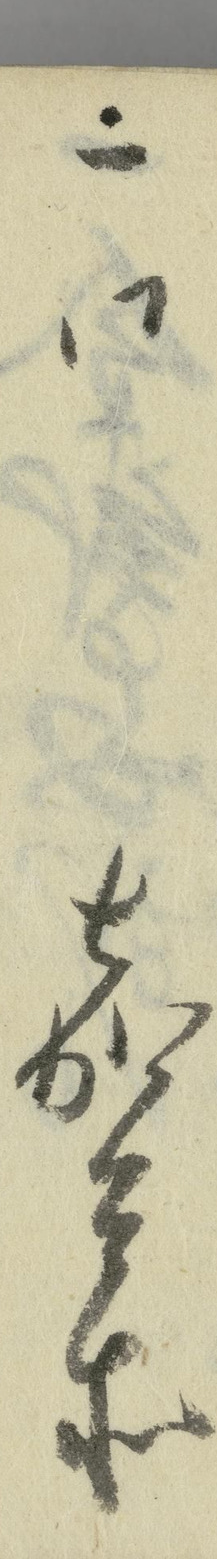一同伝兵衛
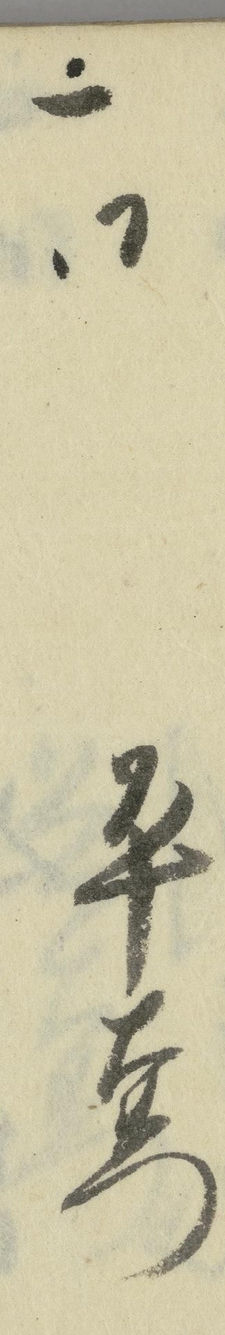一同平右衛門
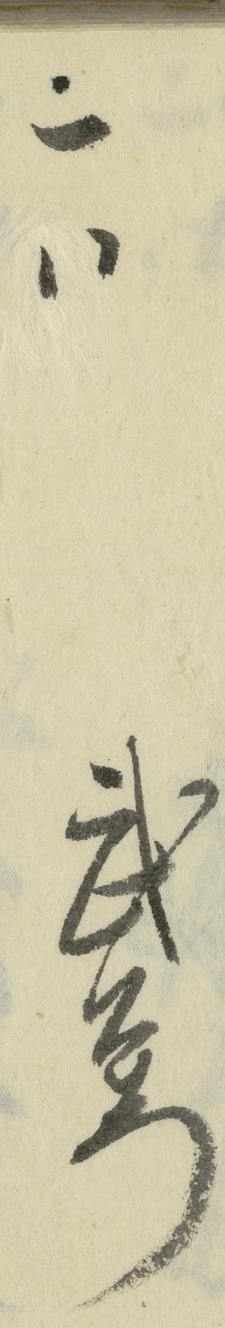一同武右衛門
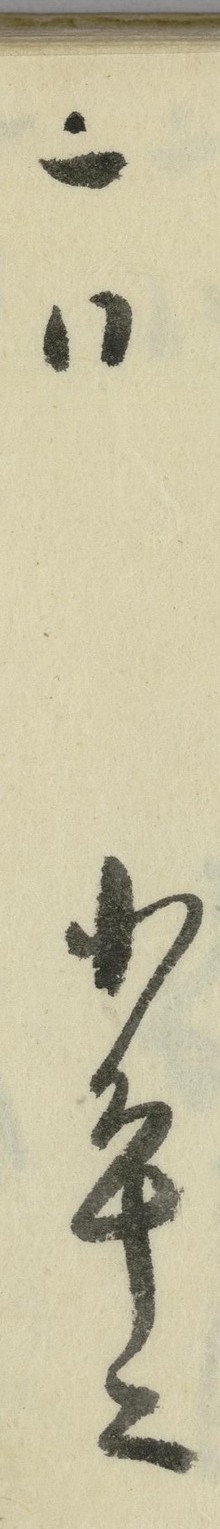一同小平二
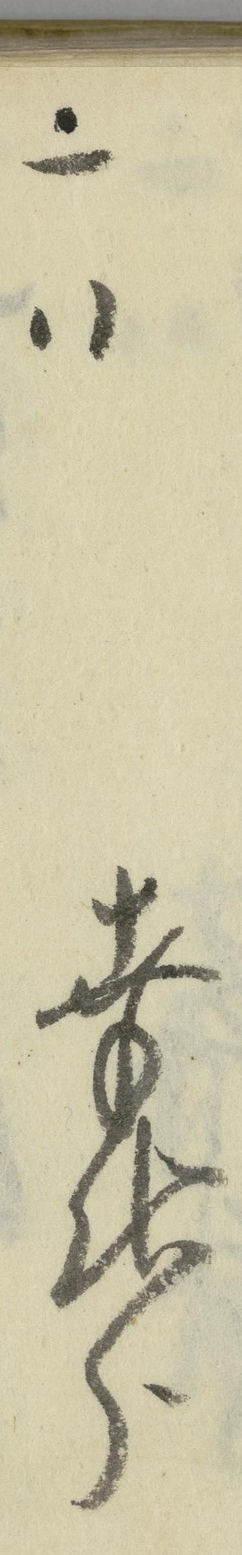一同幸次郎
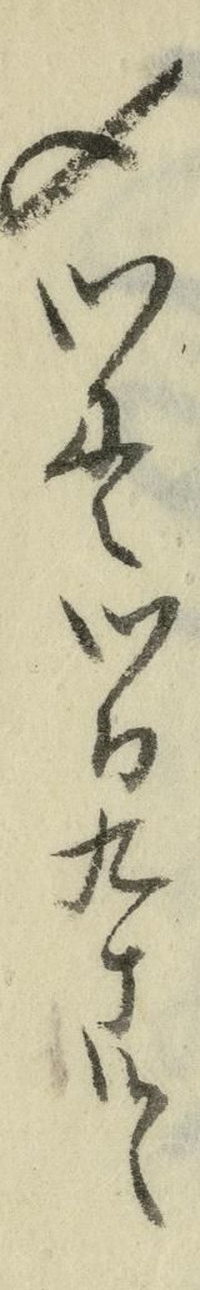〆弐貫弐百九十二文

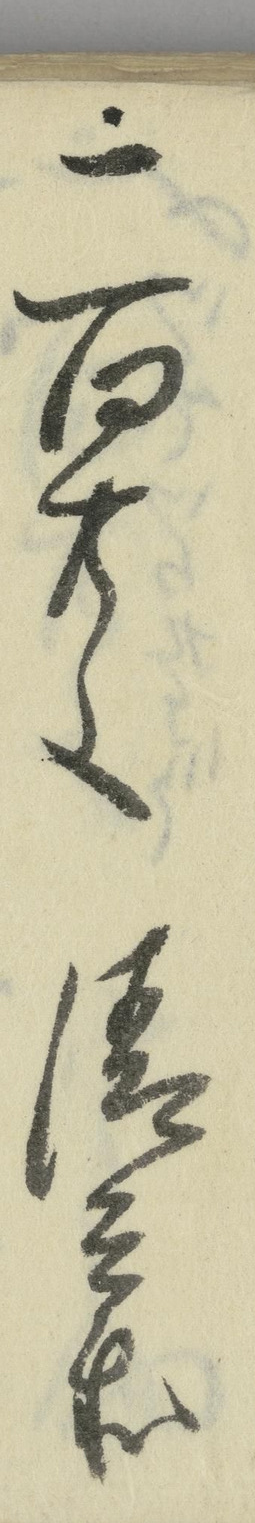一百廿文清兵衛
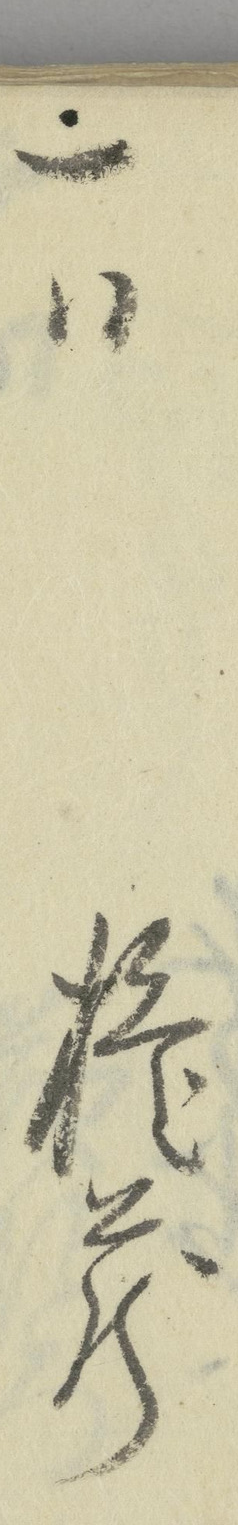一同権蔵
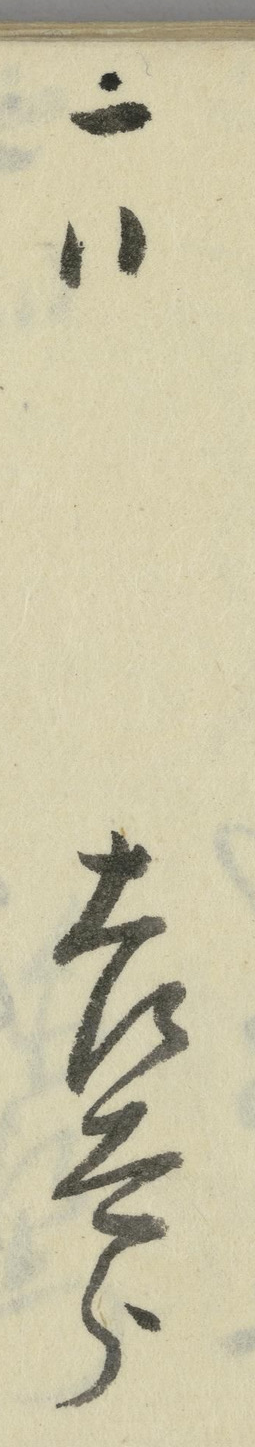一同吉太郎
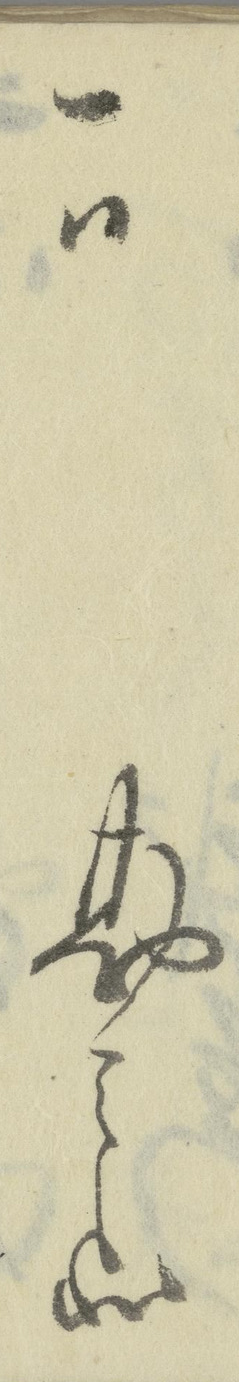一同勘兵衛
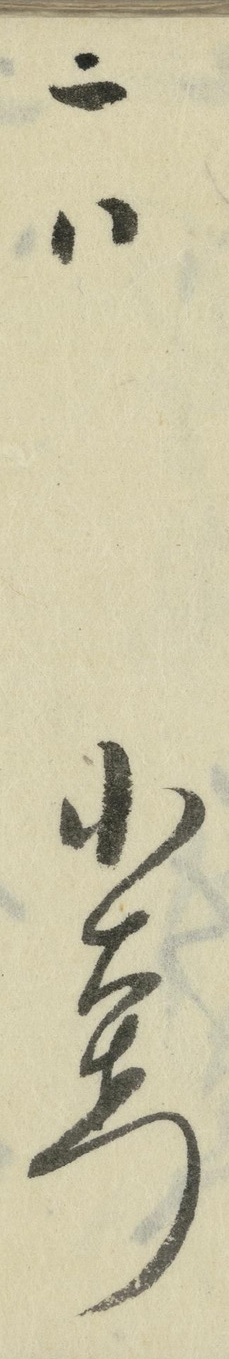一同小右衛門
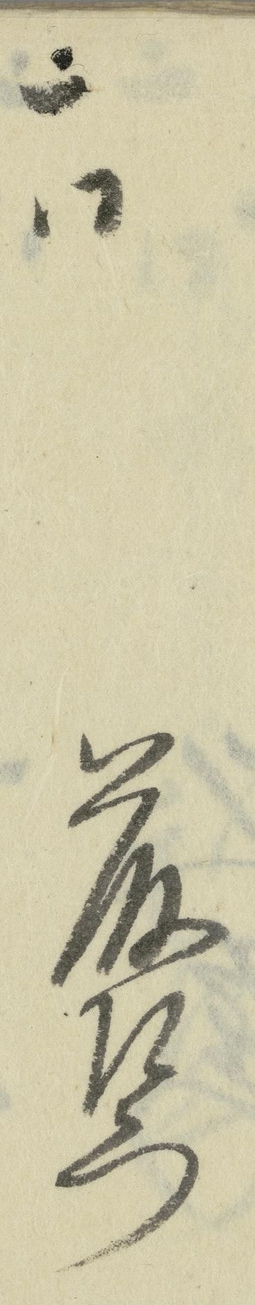一同藤左衛門
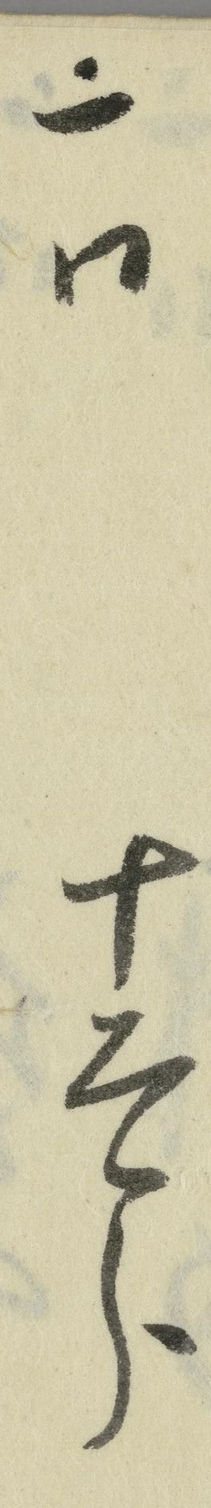一同幸助
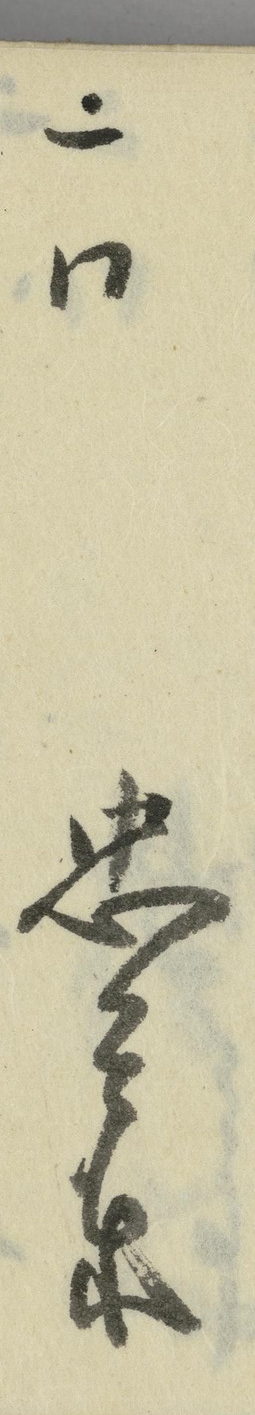一同忠兵衛

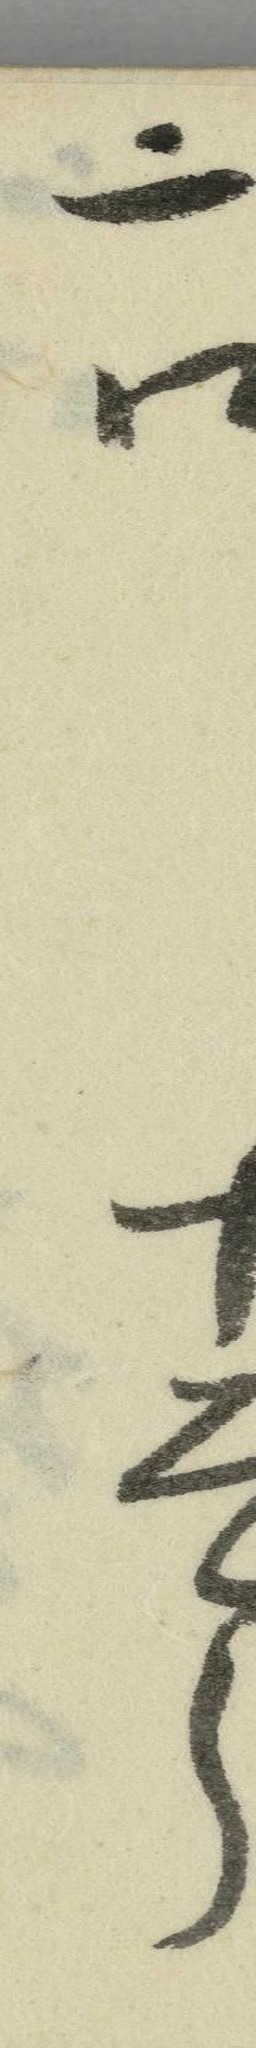一同庄三郎
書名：天明淺間噴火ニ関スル書類
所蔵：東京大学地震研究所図書室 Earthquake Research Institute Library, The University of Tokyo, JAPAN
